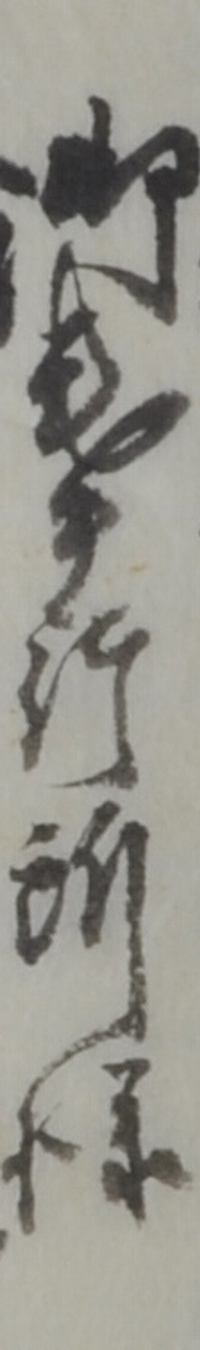御奉行所様
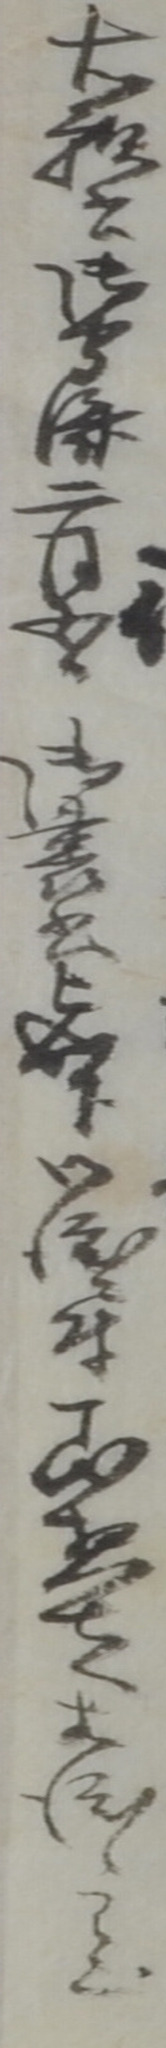右願書御聞済ニ月五日御裏書被成下御渡ニ付丁代惣七へ相渡候已上

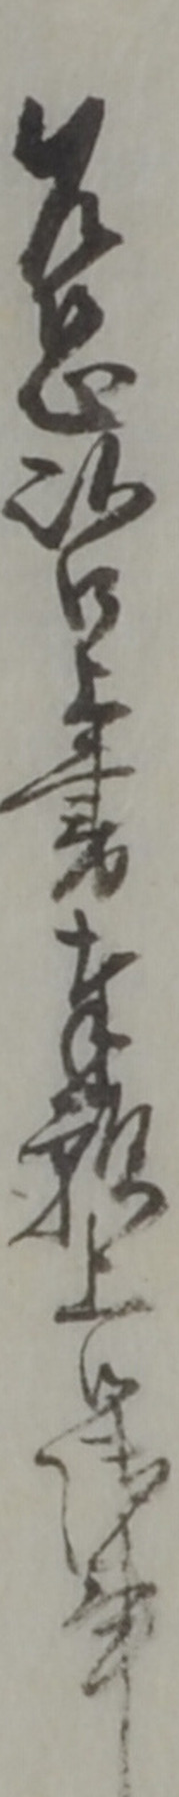乍恐以口上書奉願上候御事
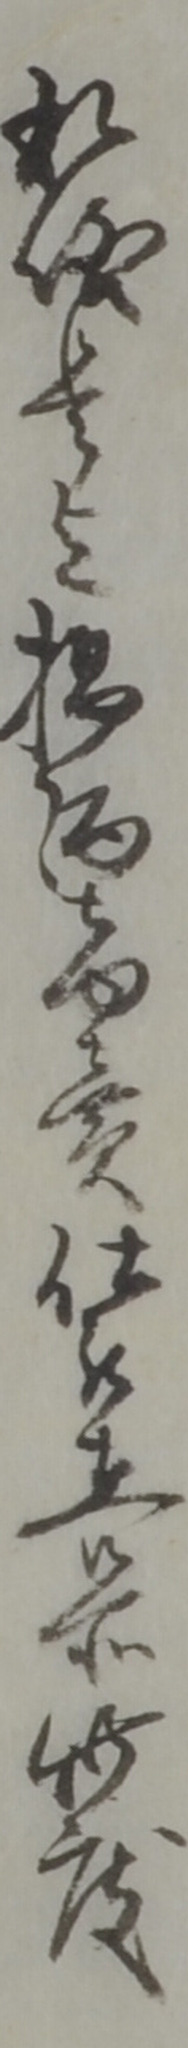私儀是迄揚酒商売仕罷在候所此度
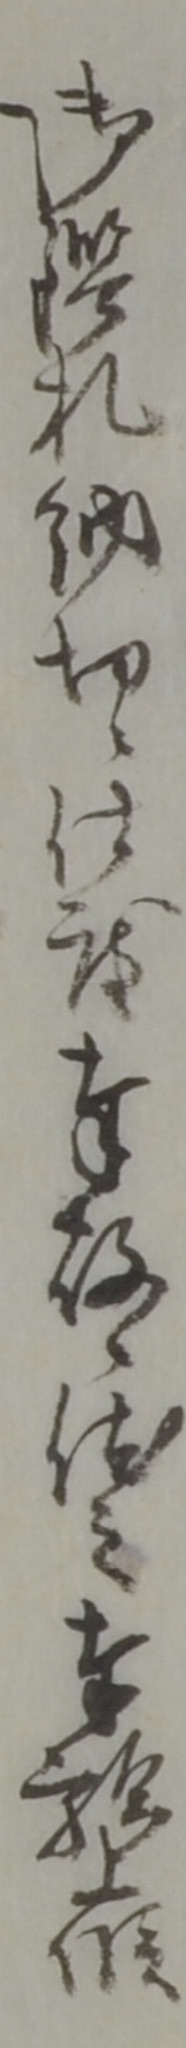御鑑札納切ニ仕度奉存候依之奉願上候
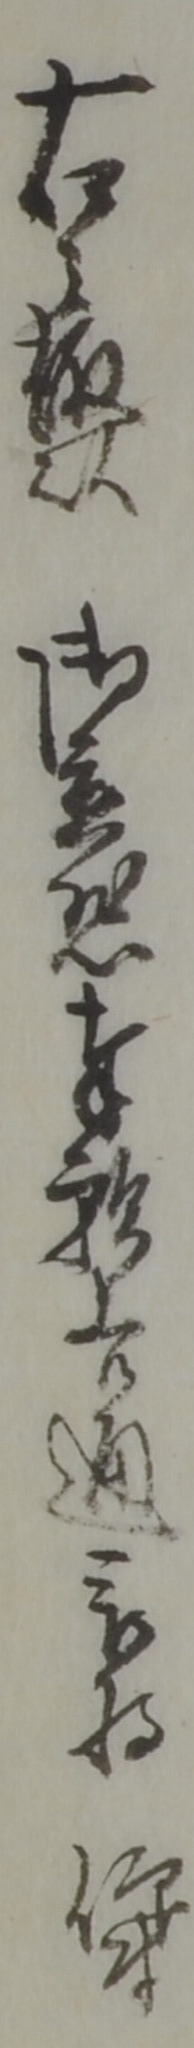右之趣以御慈悲奉願上候通被為仰付
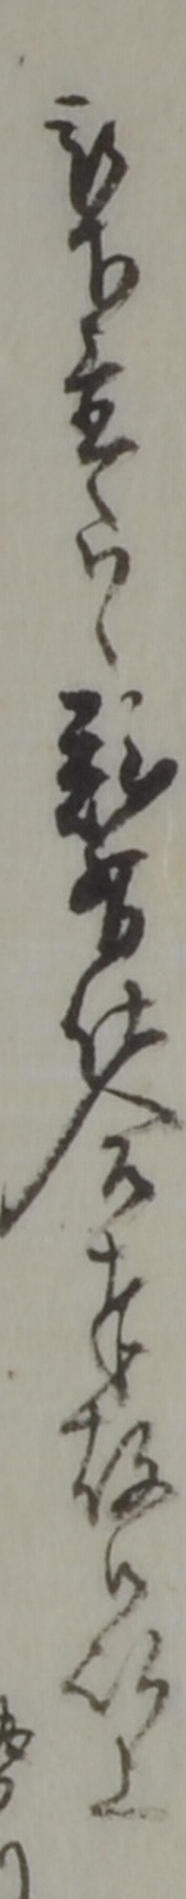被下置候ハヽ難有仕合奉存候以上
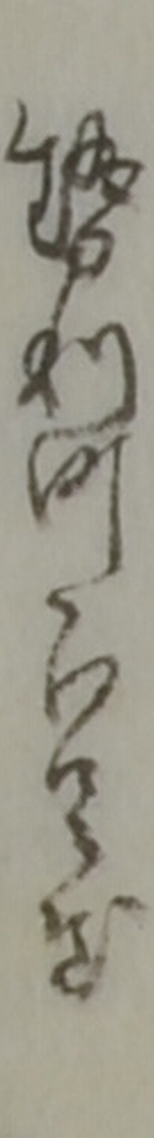勢利町百足屋
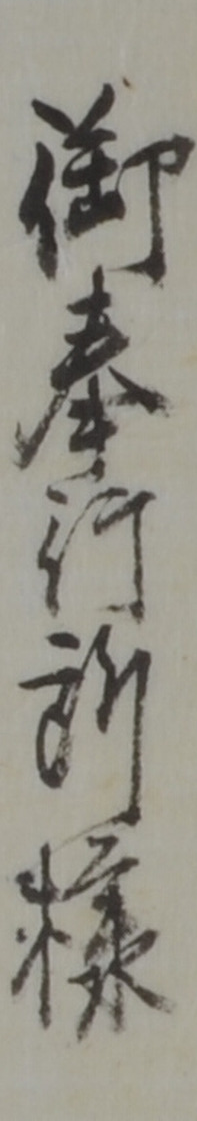御奉行所様
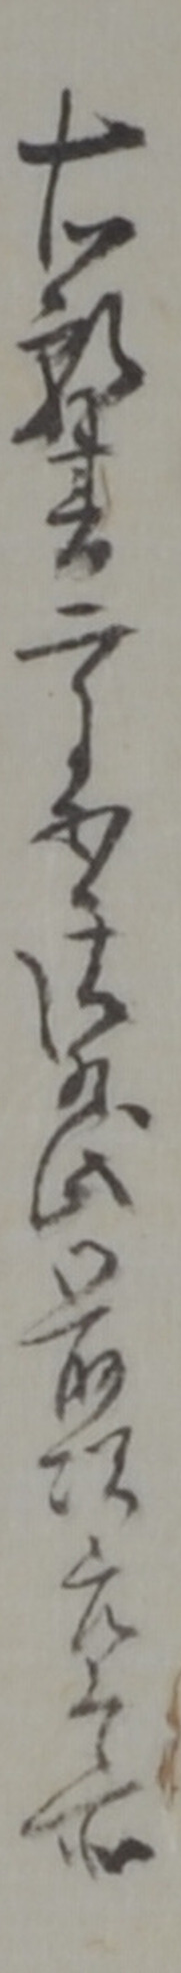右願書二月五日請取此御取次差上候所
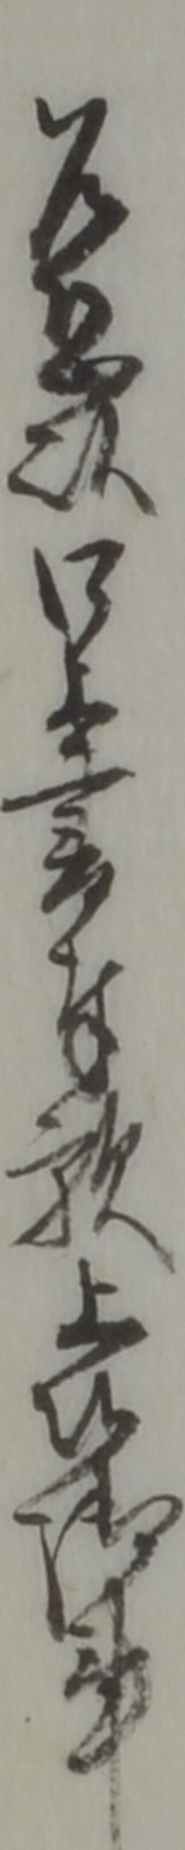乍恐以口上書奉願上候御事
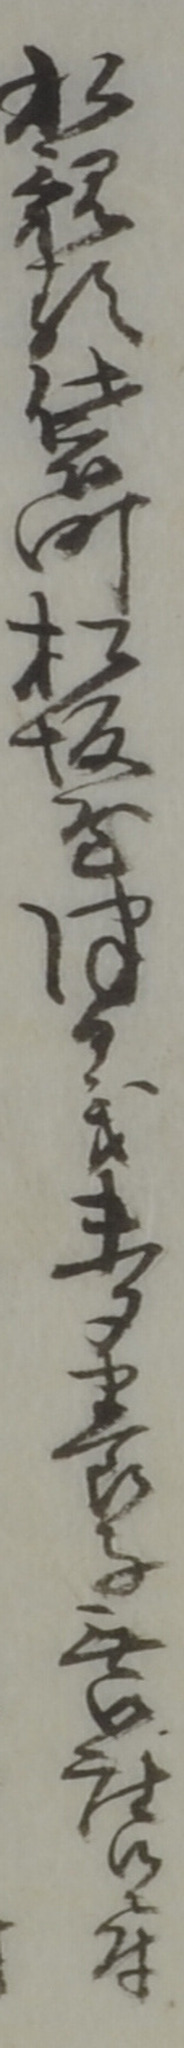私親類袋町松坂屋つる義未タ養子無御座候ニ付
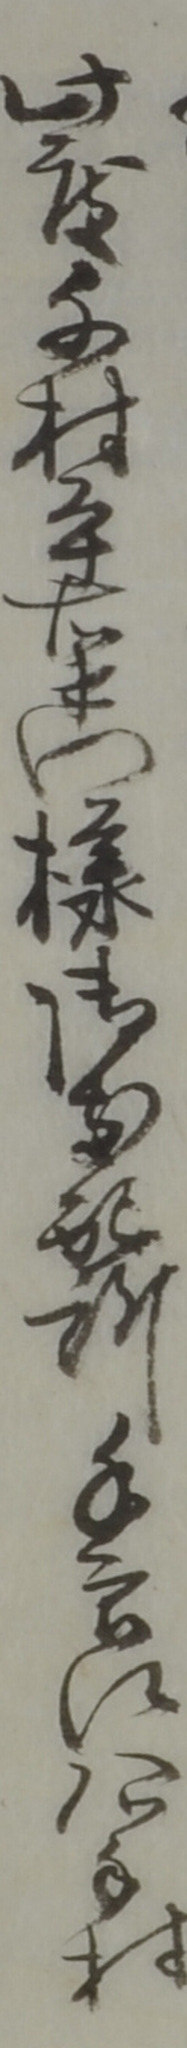此度千村平右衛門様御支配所手良郷八ツ手村
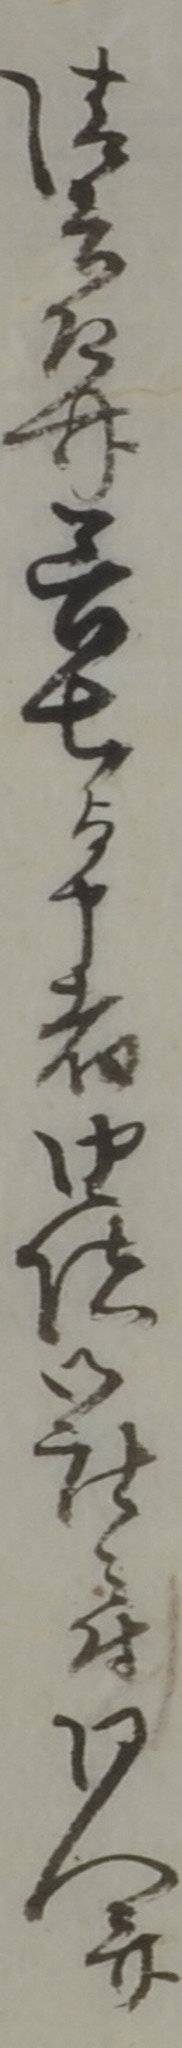清吉厄介善七与申者由緒御座候二付同人幷
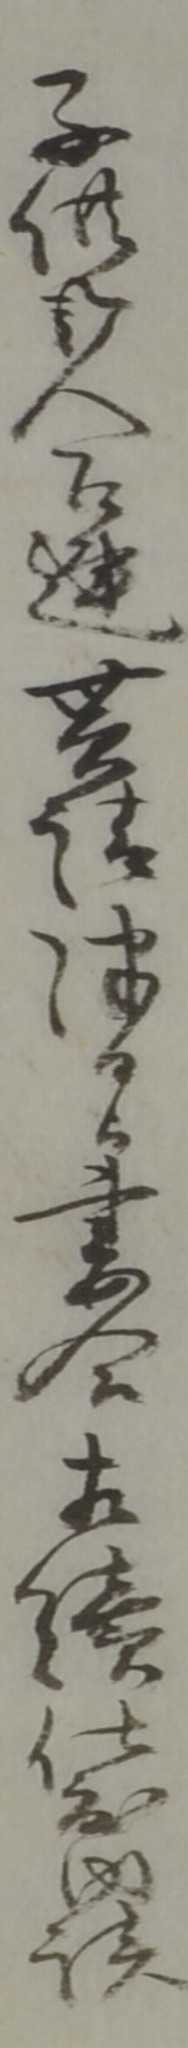子供弐人召連貰請つると妻合相続仕度内談
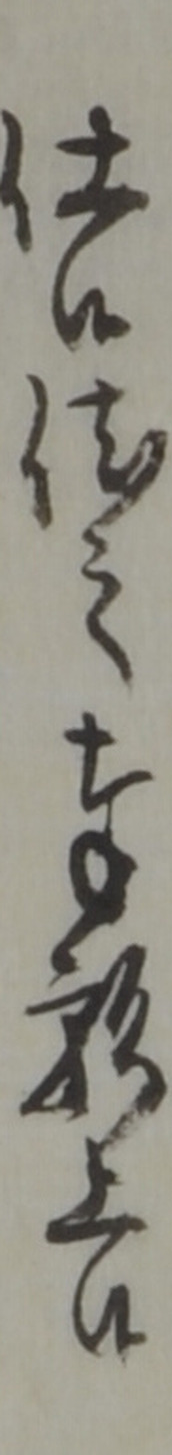仕候依之奉願上候
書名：諸願書控簿
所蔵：伊那市立高遠町図書館・合同会社AMANE
